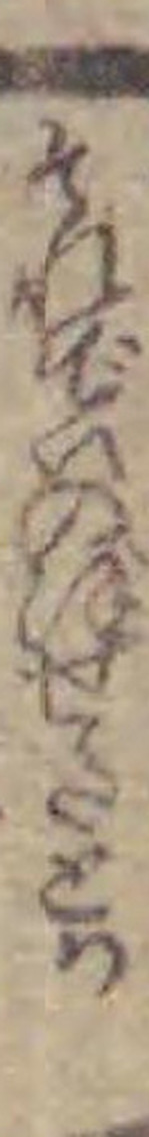それではのぼせたとか
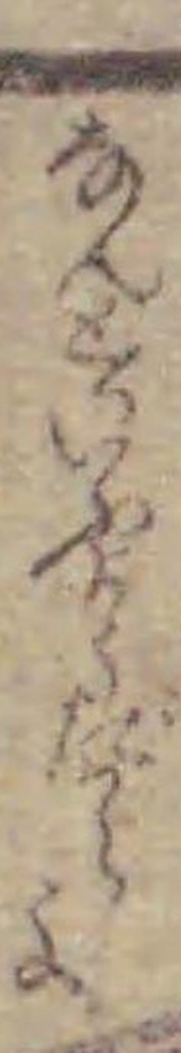なんとかいふようだからよ

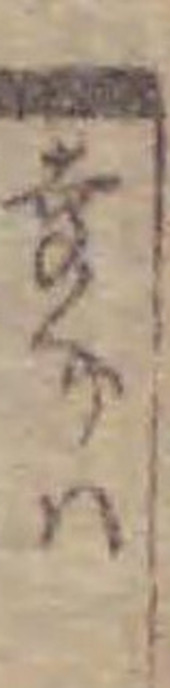幸介は
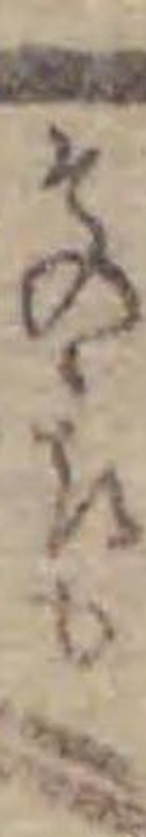そのゝちも
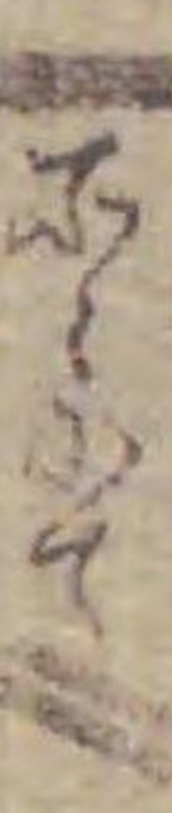所々にて
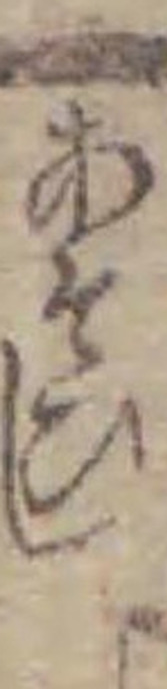あそひし
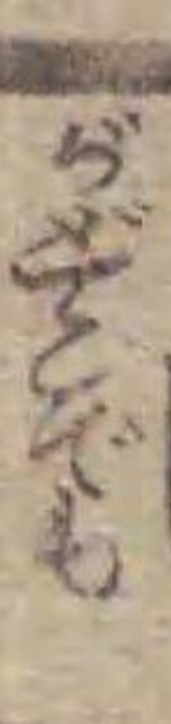がどこでも
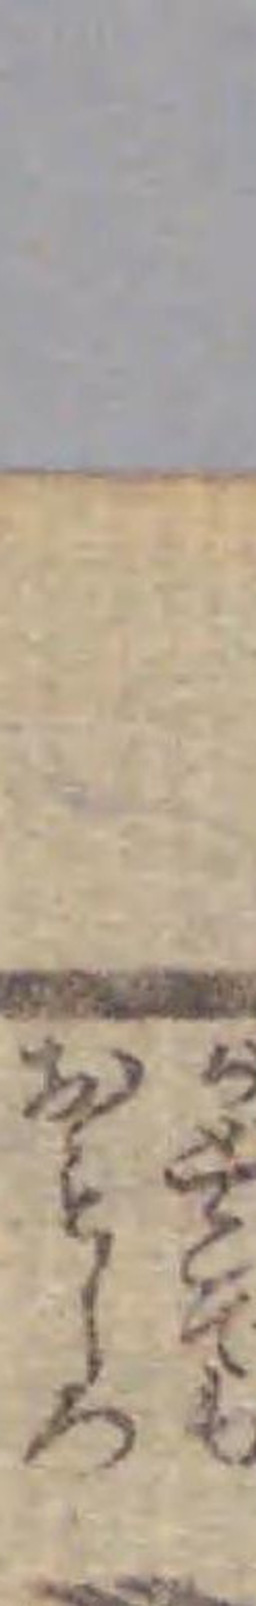おもしろ
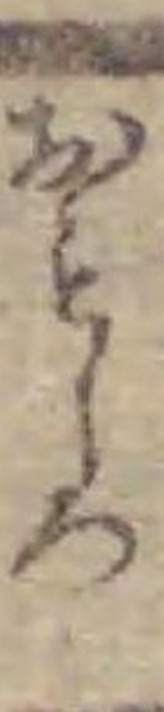おもしろ
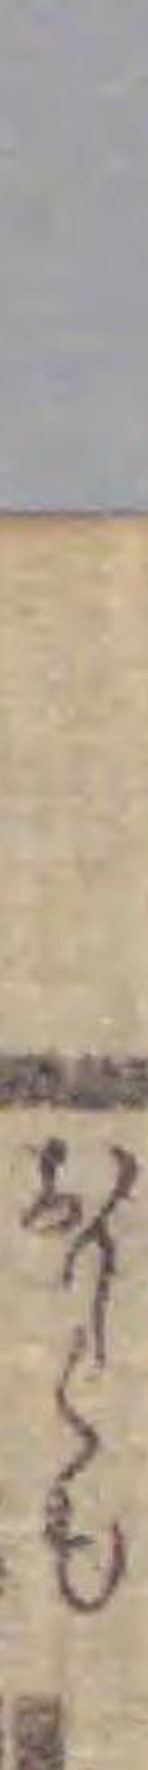おかしくも
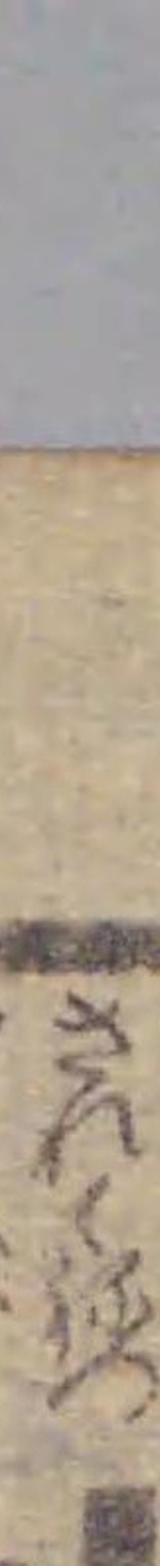されてねつ
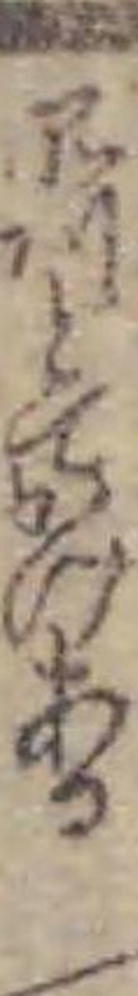品川にてかけある
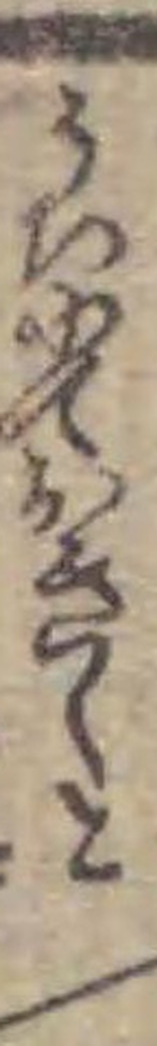うちにておきくと
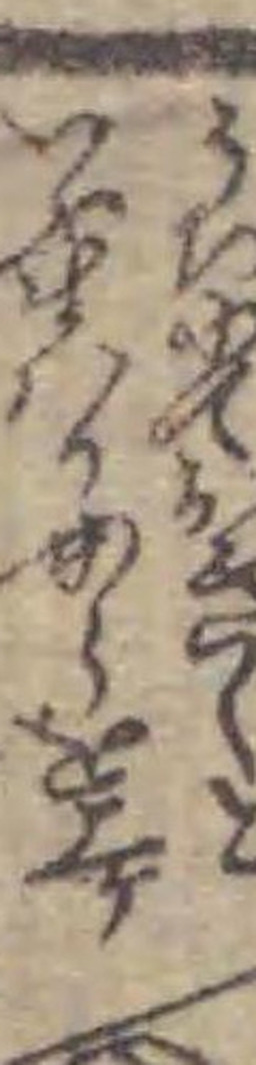いふまはり女郎を上ケ
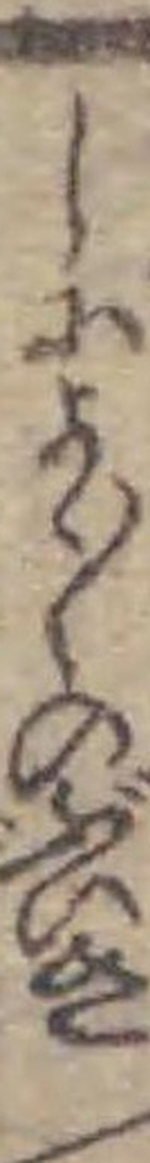しによく〳〵のぶいき
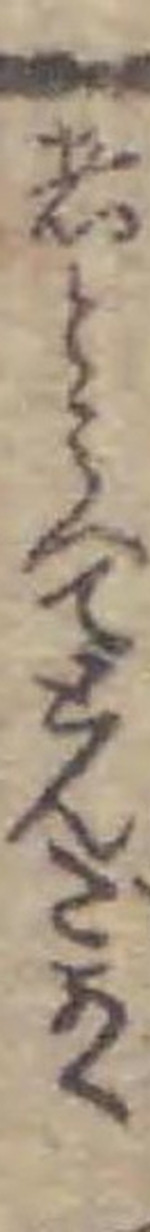者とみへてとんだよく
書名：通風伊勢物語 : 3巻
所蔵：国立国会図書館 National Diet Library, JAPAN
